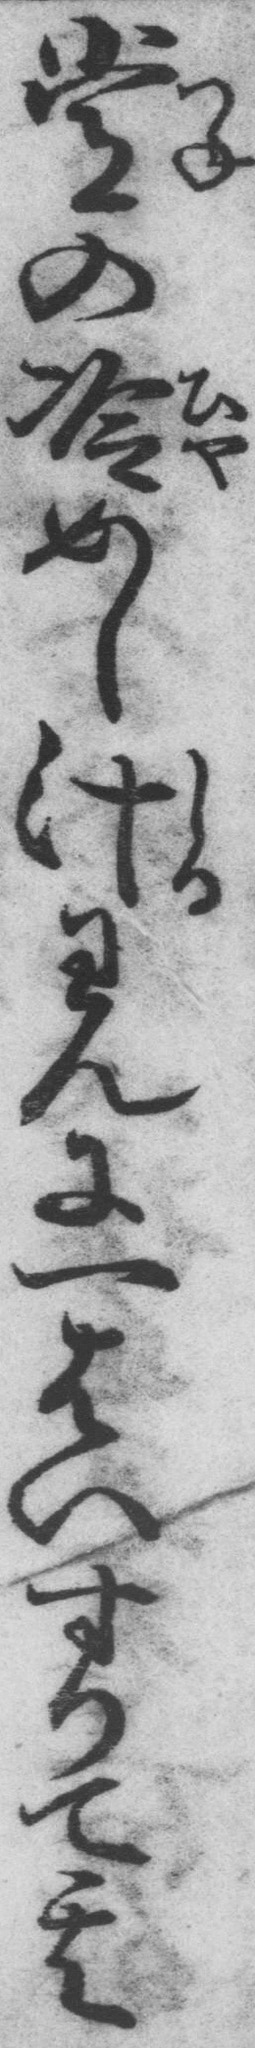常の冷めし汁わんに一はいすりて其
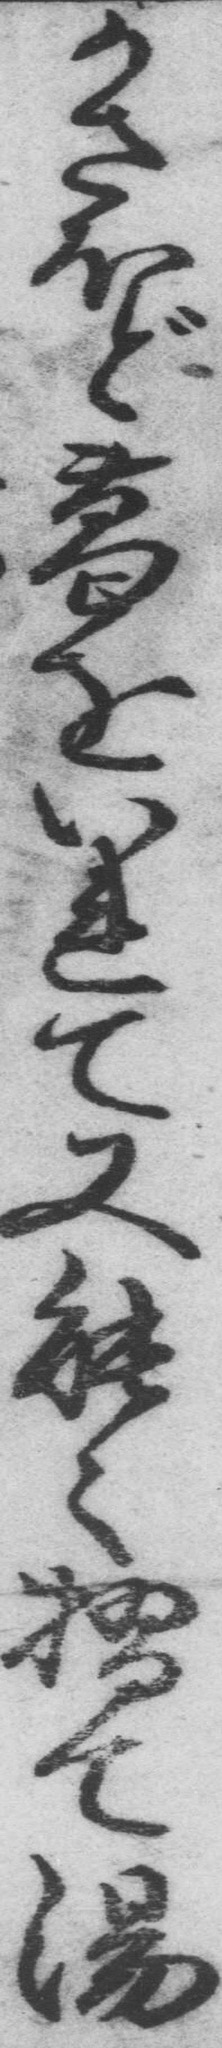かさほど葛をいれて又能く摺て湯
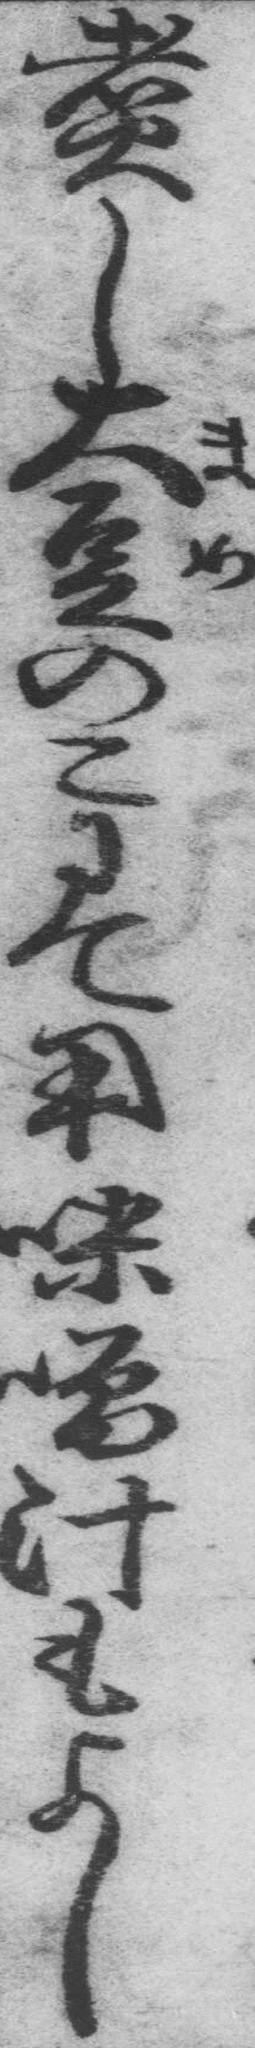煮し大豆のこにて用味噌汁もよし

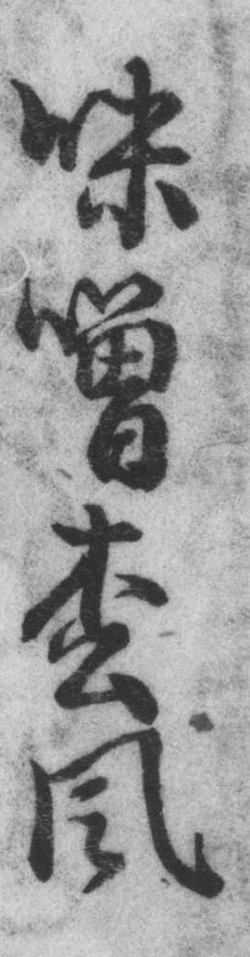味噌松風
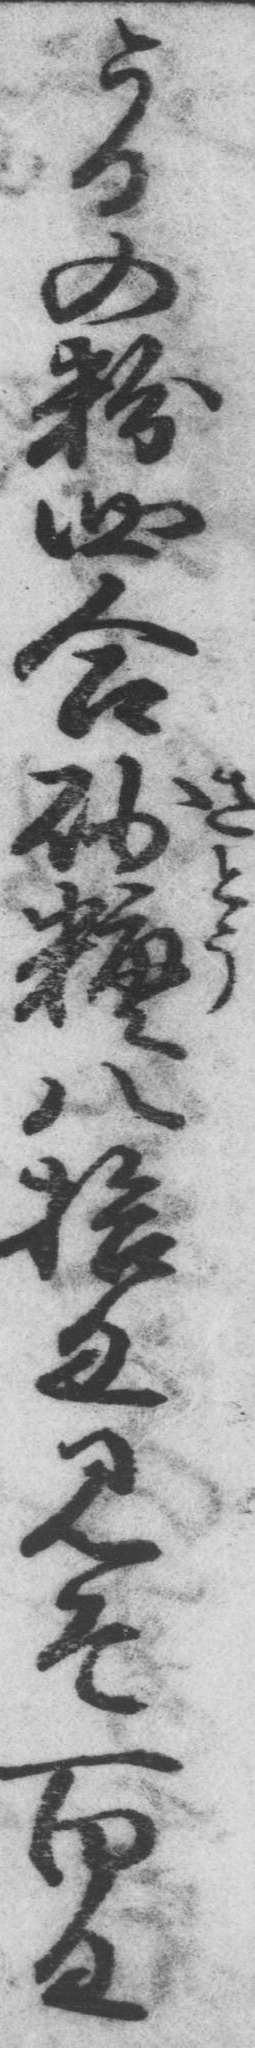うるの粉四合砂糖八拾匁みそ百匁
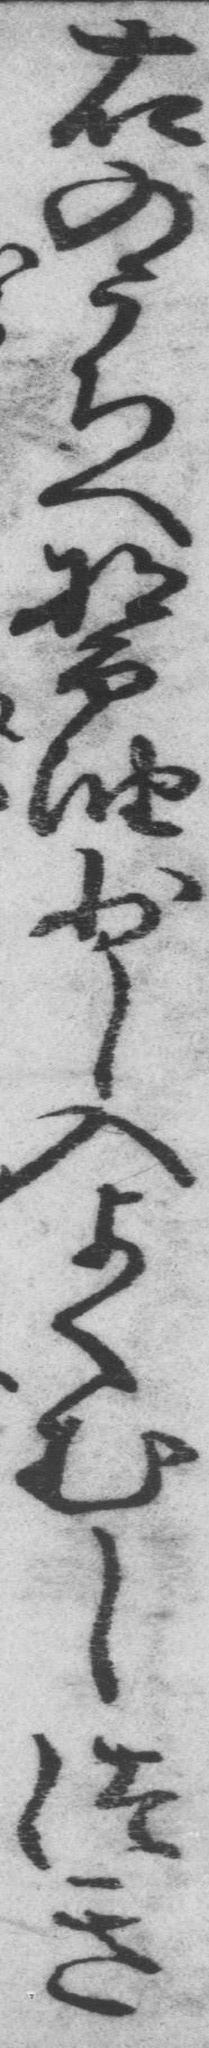右のうちへ醤油少し入よくむしつき
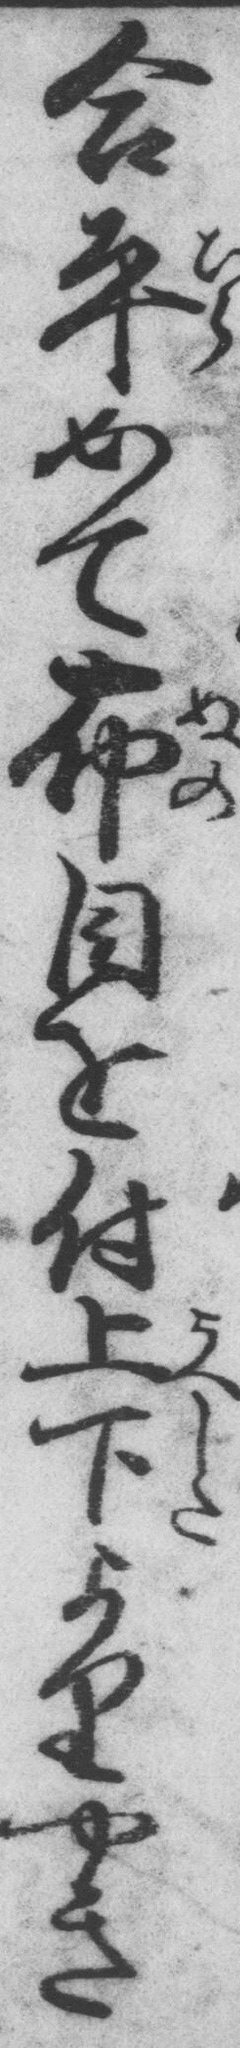合平にて布目を付上下よりやき
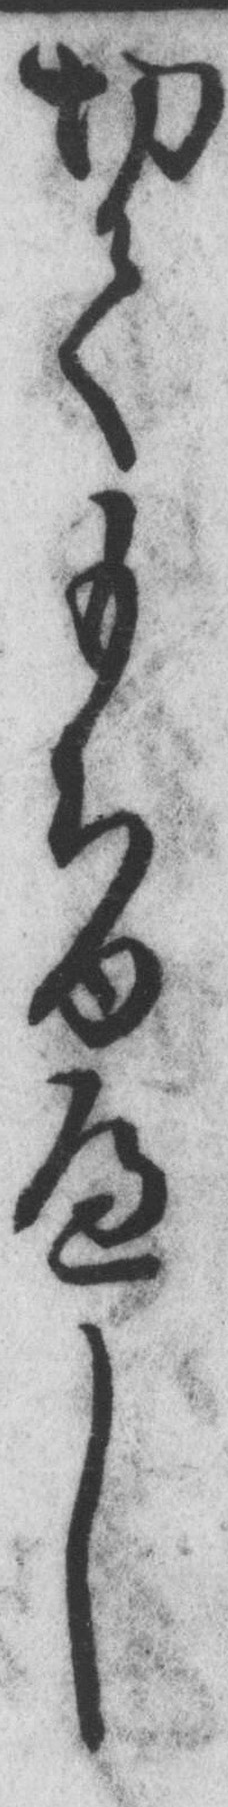切てもちゆへし
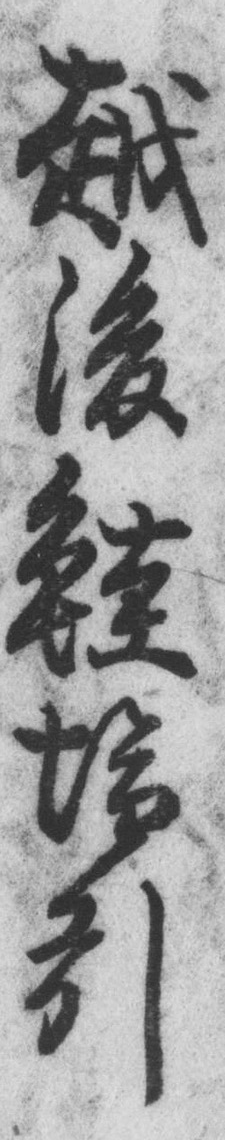越後鮭塩引
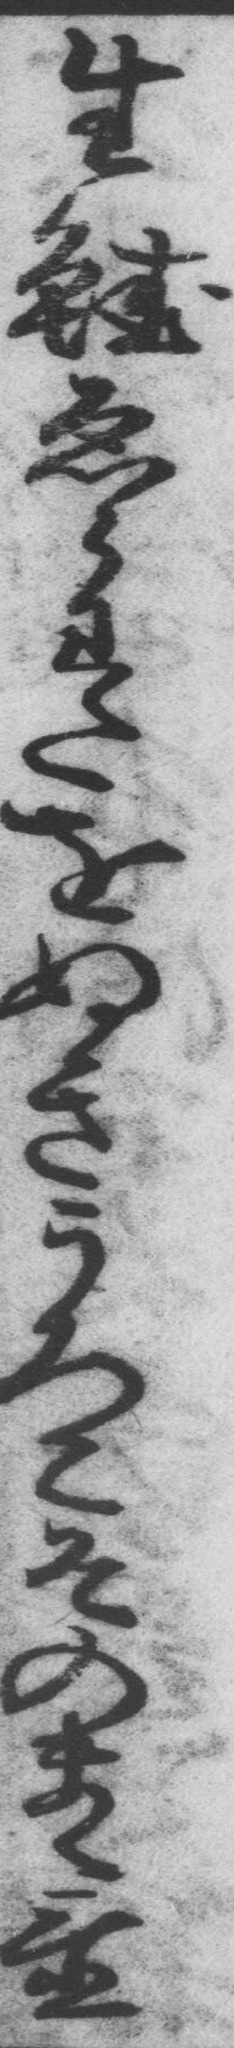生鮭ゑらわたをぬきうろこそのまゝ置
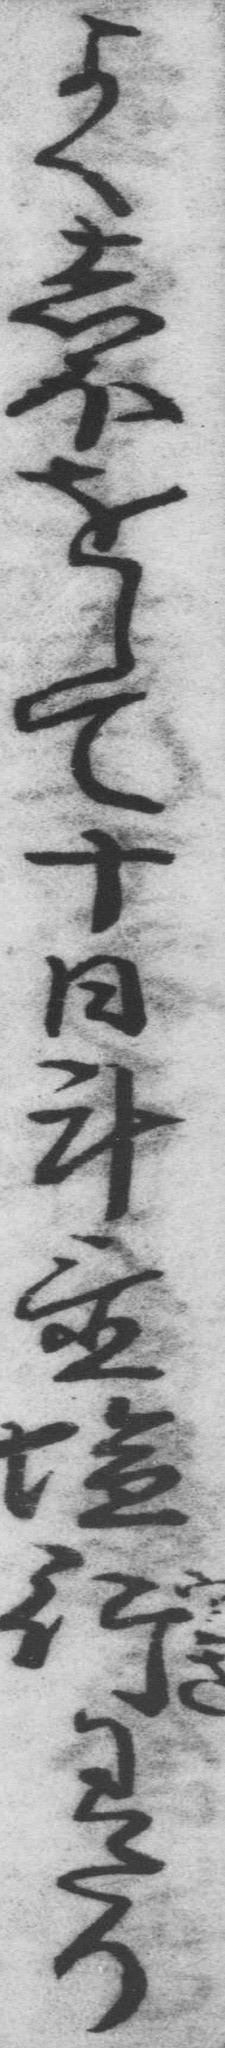よくしほをして十日斗置塩行わたり
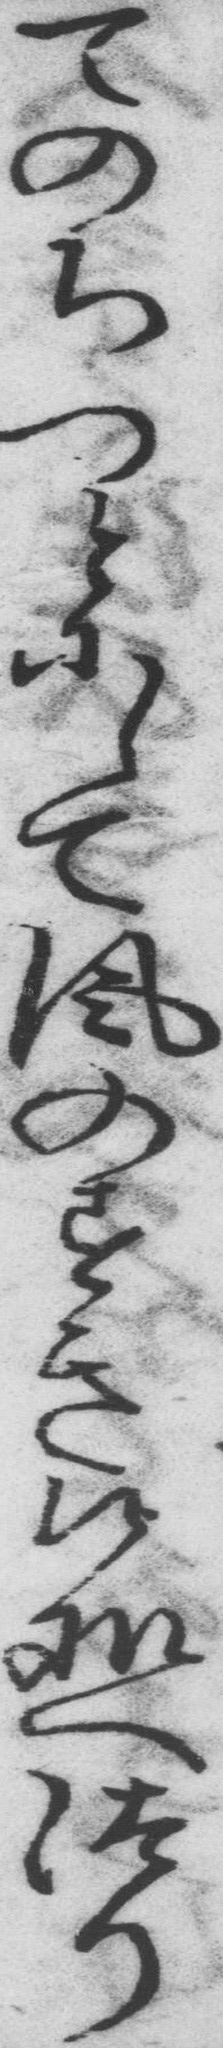てのちつとにして風のすき候処へつり
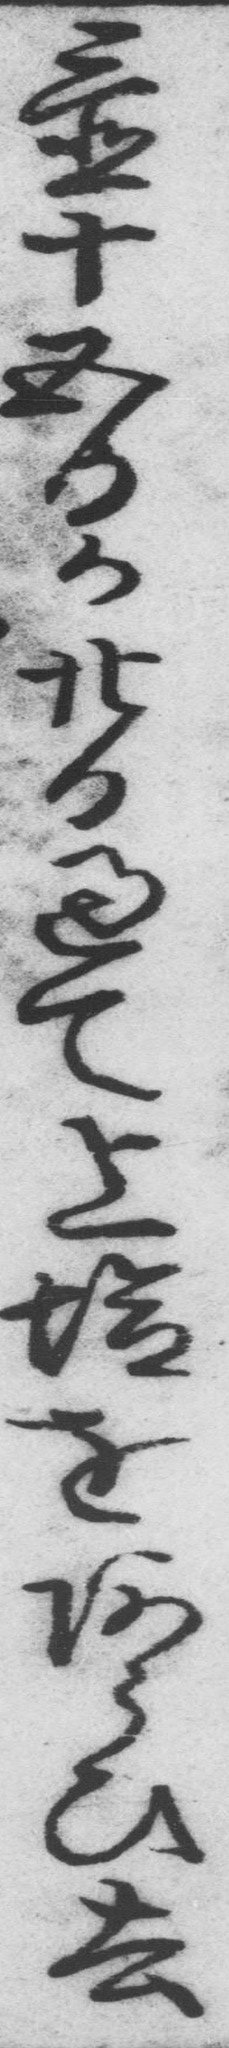置十五日か廿日過て上塩をあらひ去
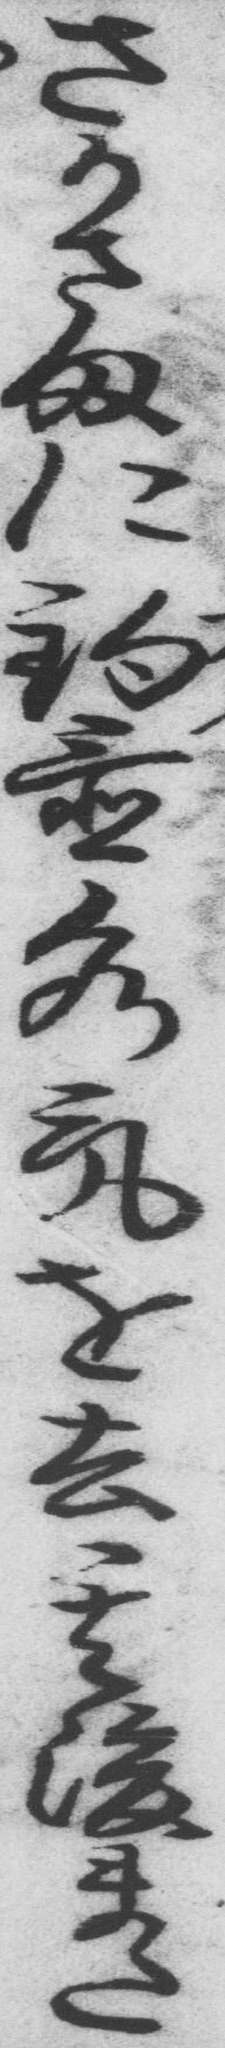さかさまに釣置水気を去其後また
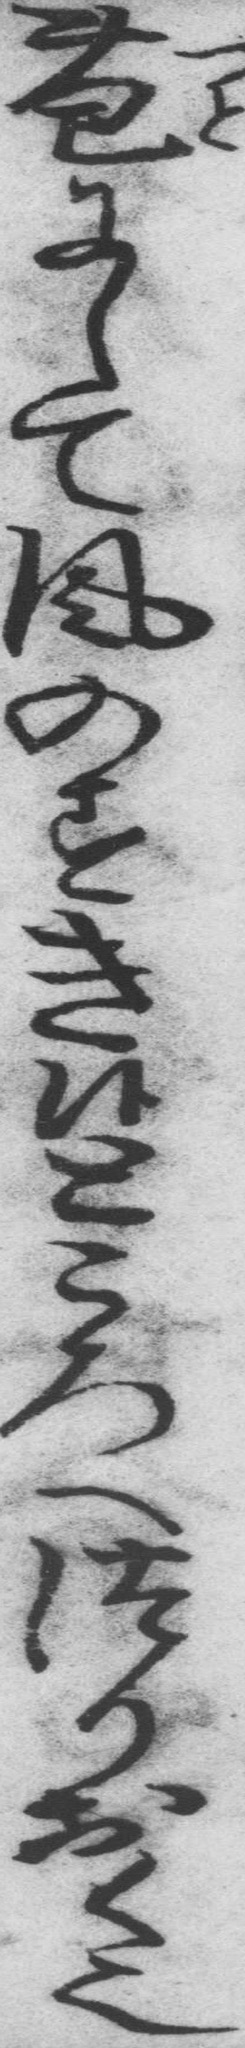苞にして風のすき候ところへつりおく也
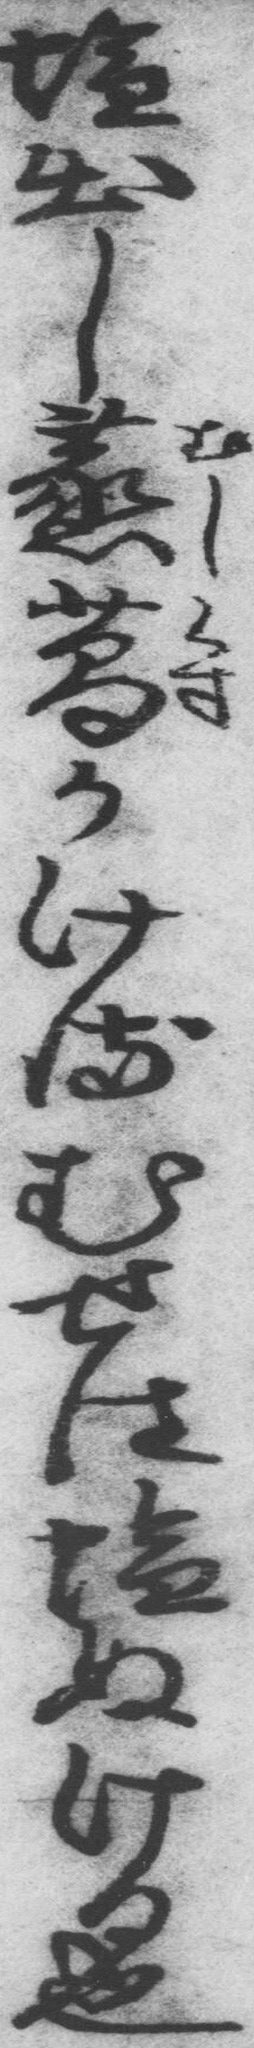塩出し蒸葛かけるむせは塩ぬける也
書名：料理山海郷
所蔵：大阪府立大学学術情報センター 国文学研究資料館
